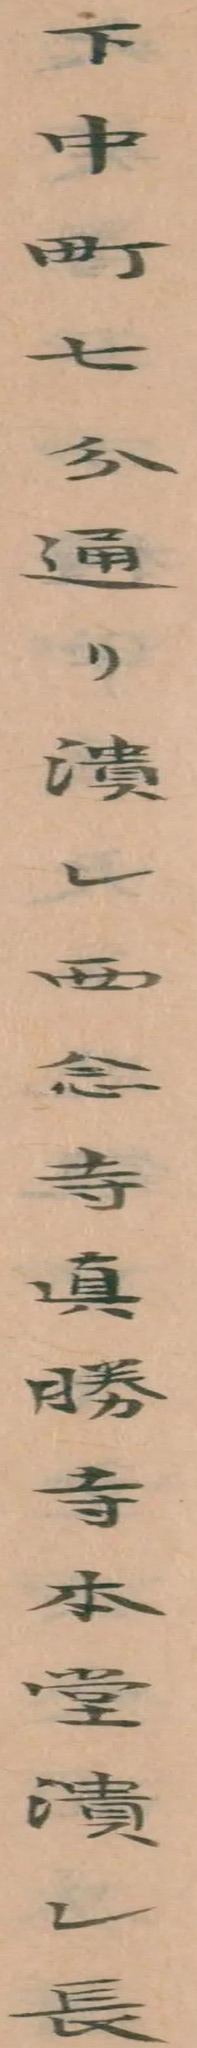下中町七分通り潰レ西年寺真勝寺本堂潰レ長
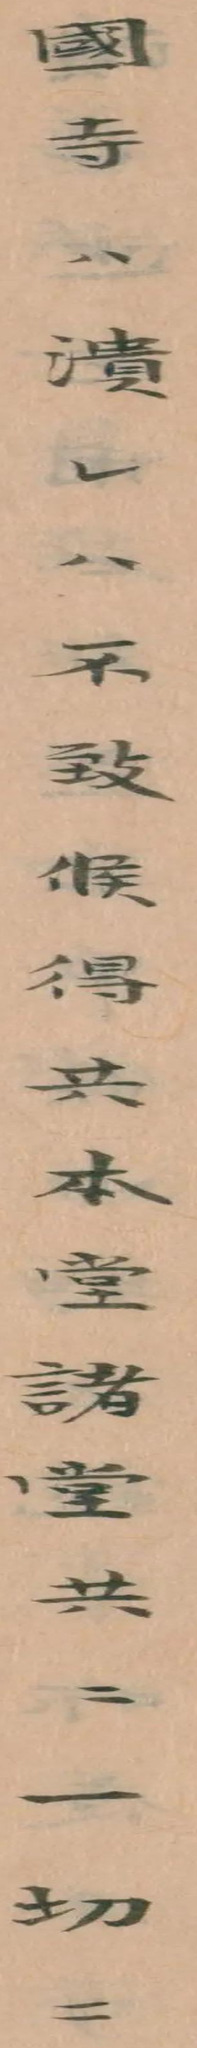国寺ハ潰レハ不致候得共本堂諸堂共二一切二
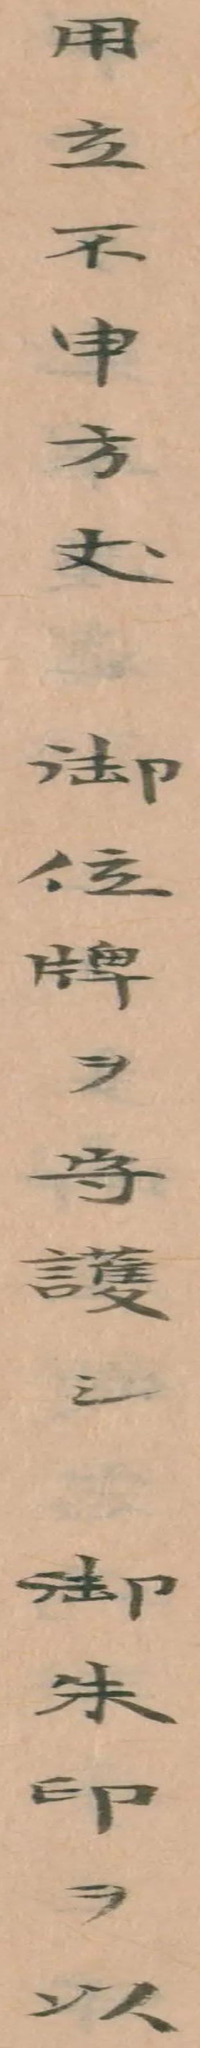用立不申方丈御位牌ヲ守護シ御朱印ヲ以
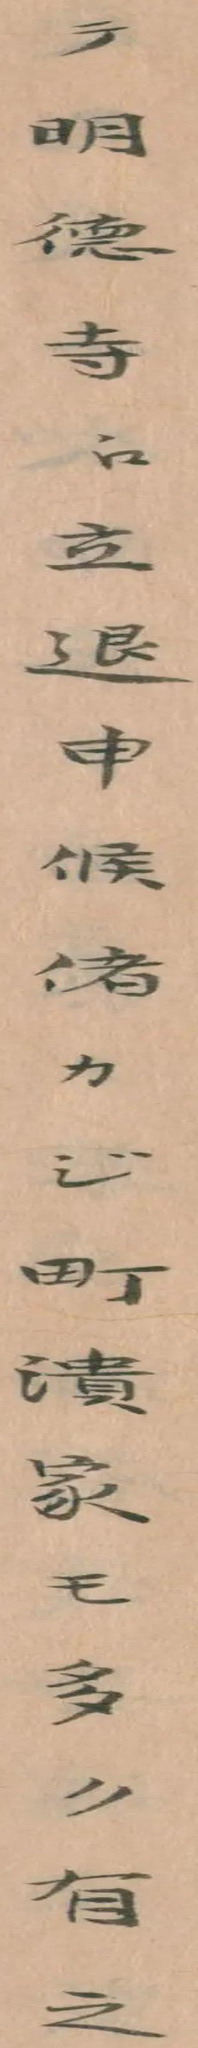テ明徳寺江立退申候偖カジ町潰家モ多ク有之
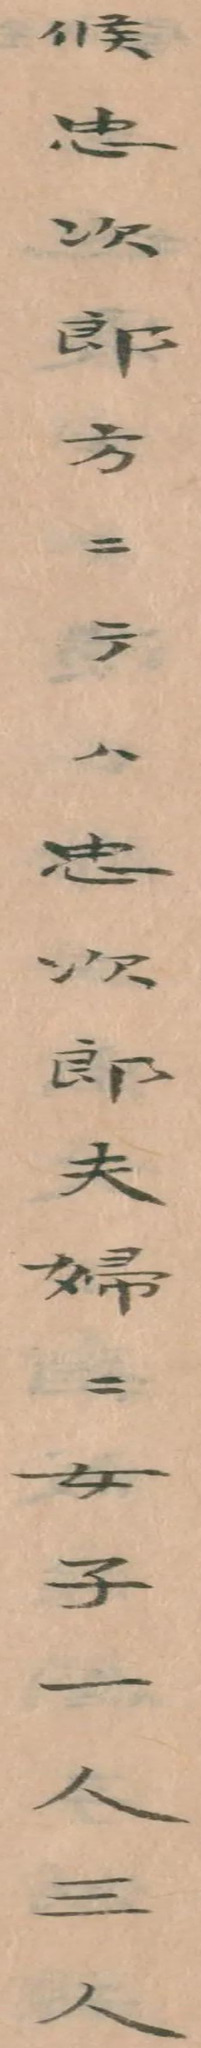候忠次郎方ニテハ忠次郎夫婦二女子一人三人
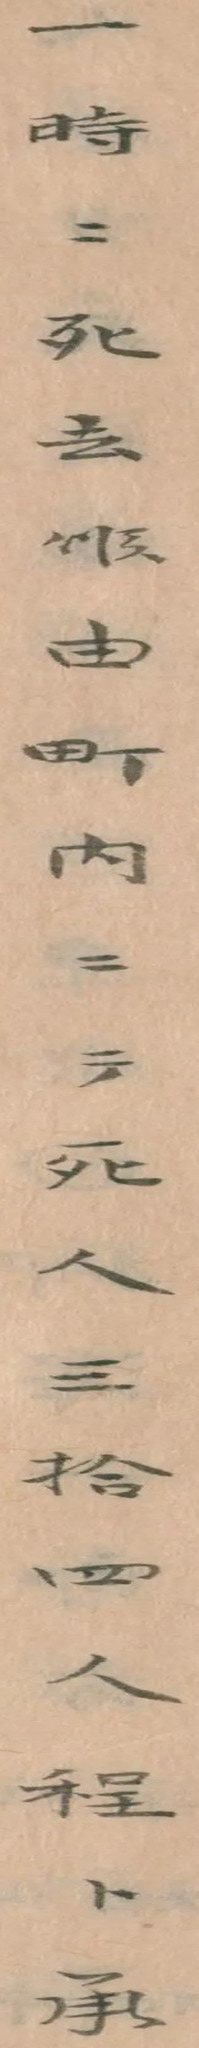一時二死去候由町内ニテ死人三拾四人程ト承
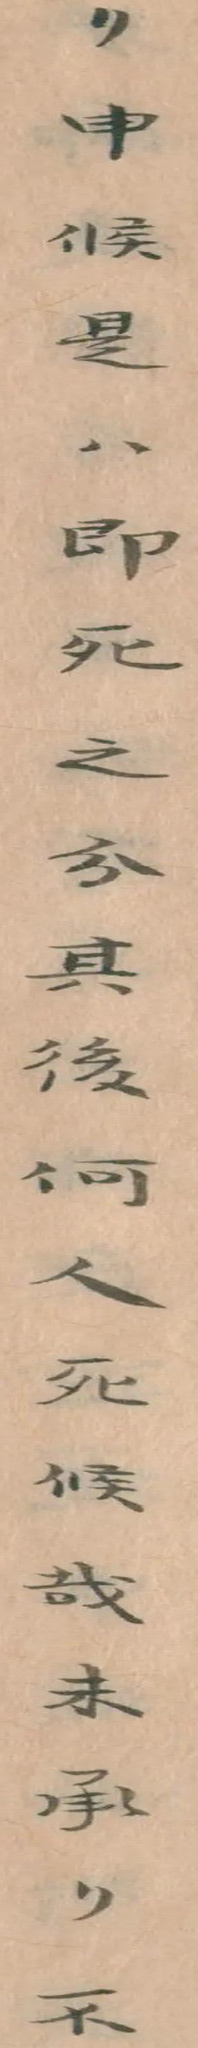り申候是ハ即死之分其後何人死候哉未承り不
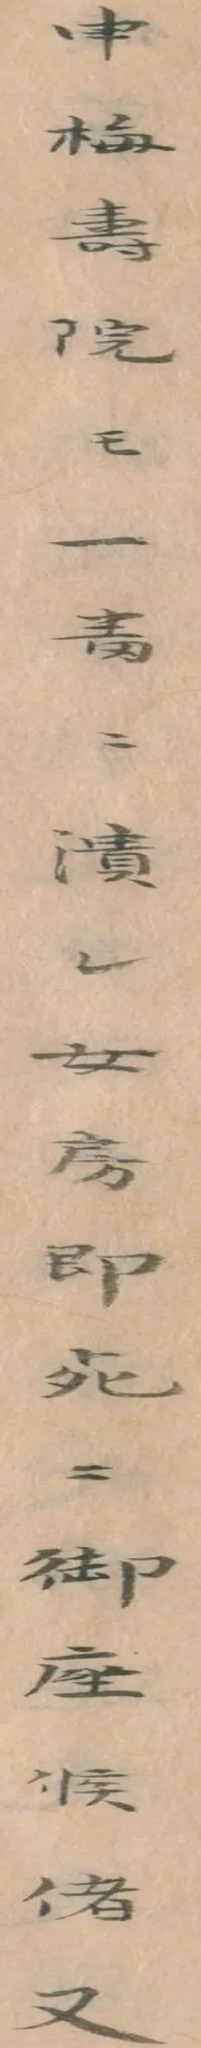申梅寿院モ一番二潰レ女房即死二御座候偖又
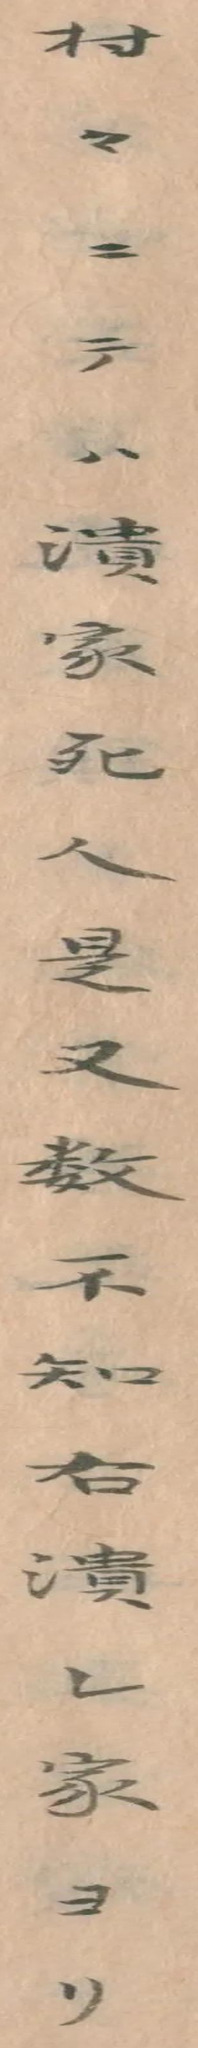村々二テハ潰家死人是又数不知右潰レ家ヨリ
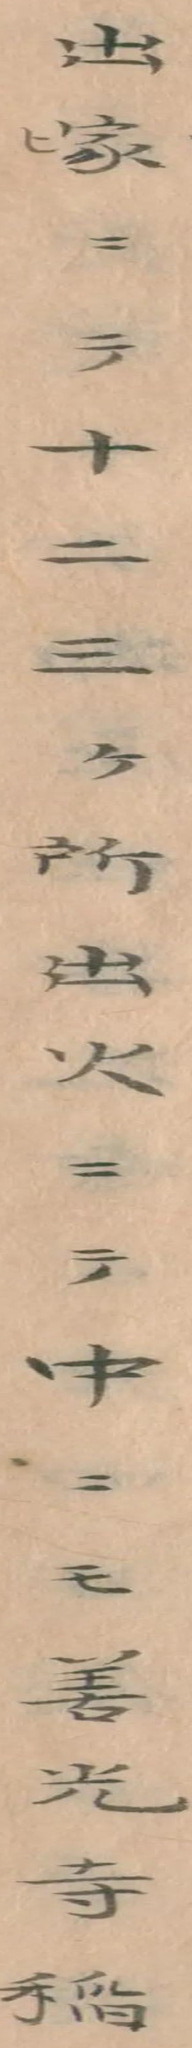出火にて十二三ヶ所出火ニテ中ニモ善光寺稲

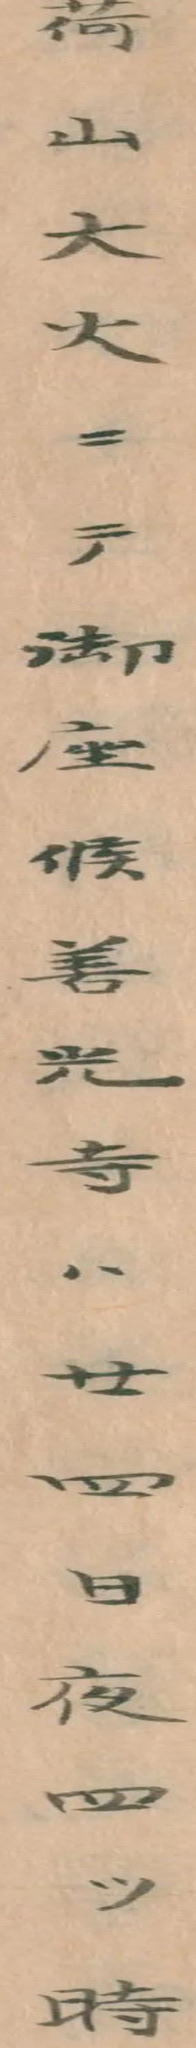荷山大火ニテ御座候善光寺ハ廿四日夜四ッ時
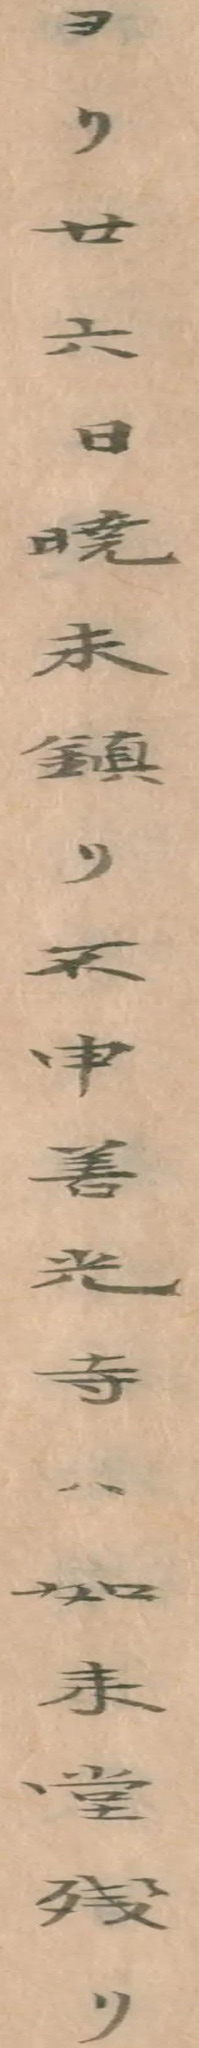ヨリ廿六日暁未鎮リ不申善光寺ハ如来堂残り
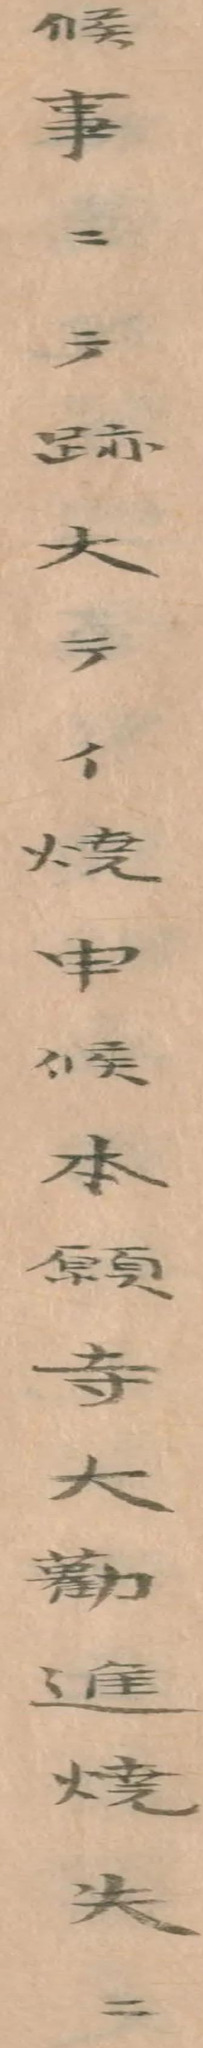候事ニテ跡大テイ焼申候本願寺大勧進焼失二
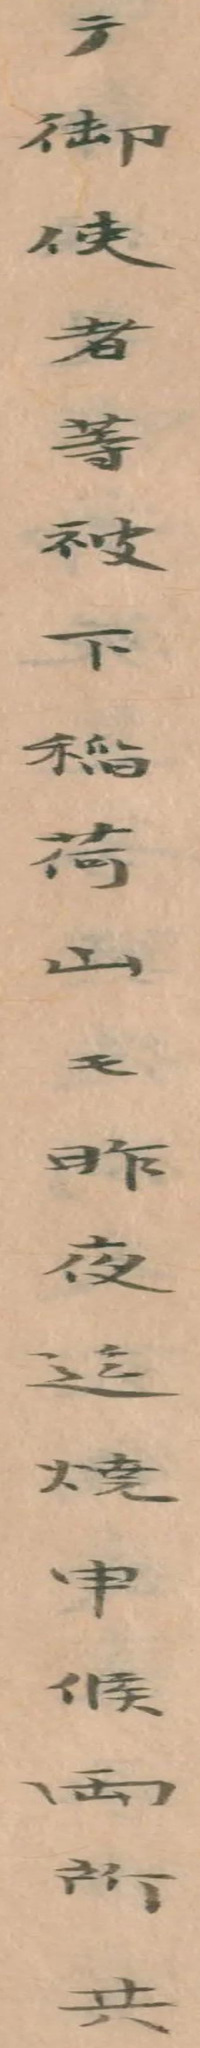テ御使者等被下稲荷山モ昨夜迄焼申候両所共
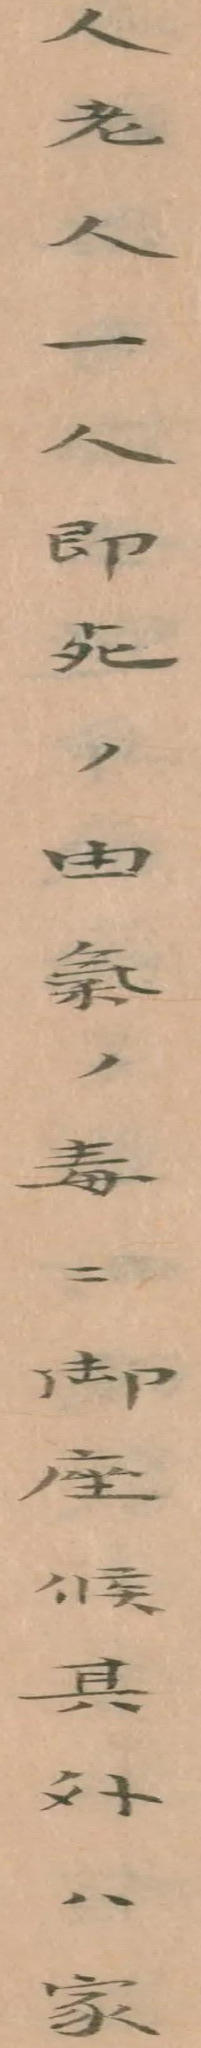認老人一人即死ノ由気ノ毒二御座候其外ハ家
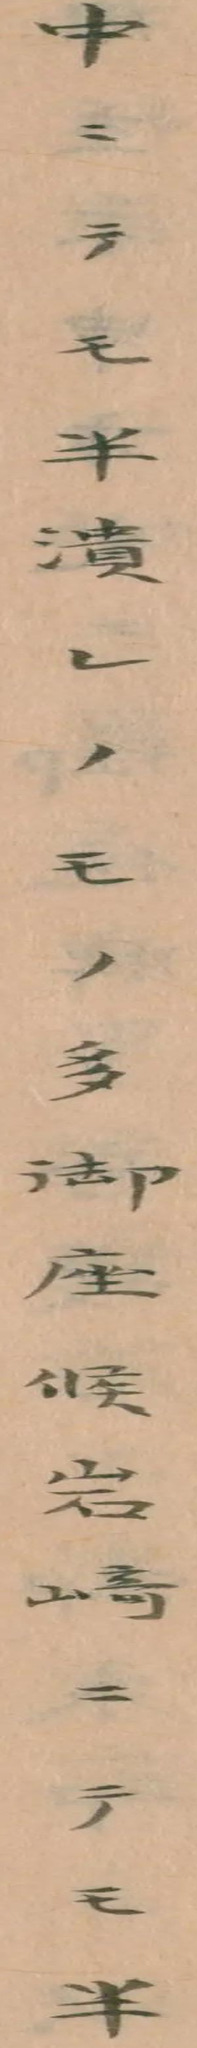注ニテモ半潰レノモノ多御座候岩崎ニテモ半
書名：地災撮要. 巻1(噴火山・地震ノ部)
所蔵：国立国会図書館 National Diet Library, JAPAN
